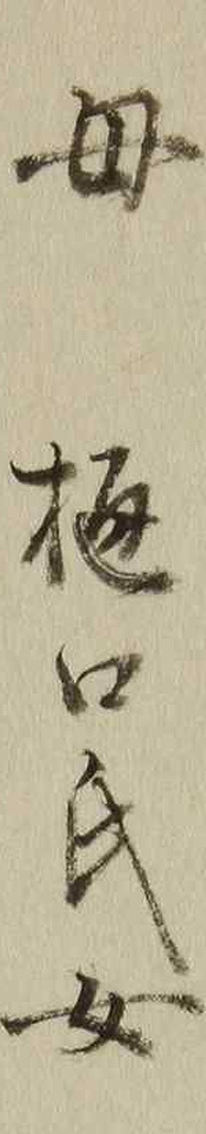母樋口氏女
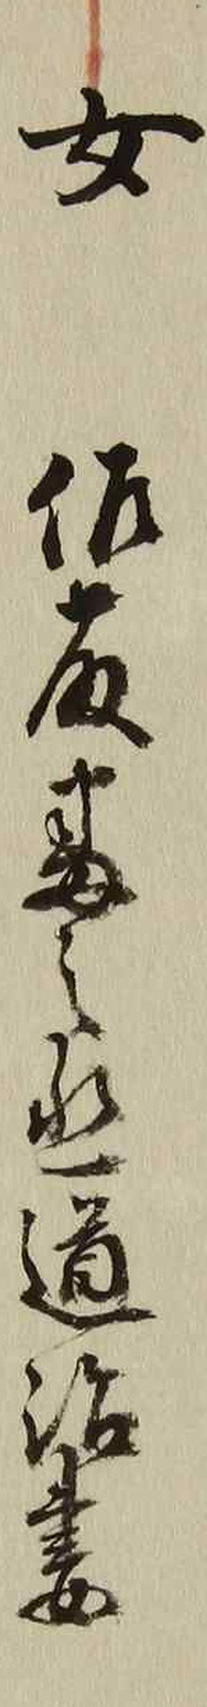女佐藤番之丞道治妻
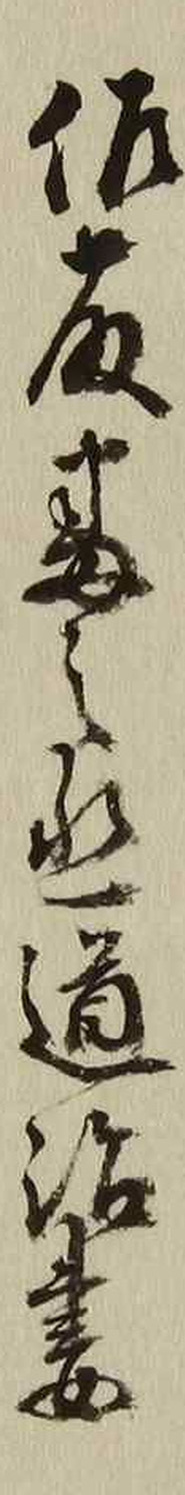女佐藤番之丞道治妻
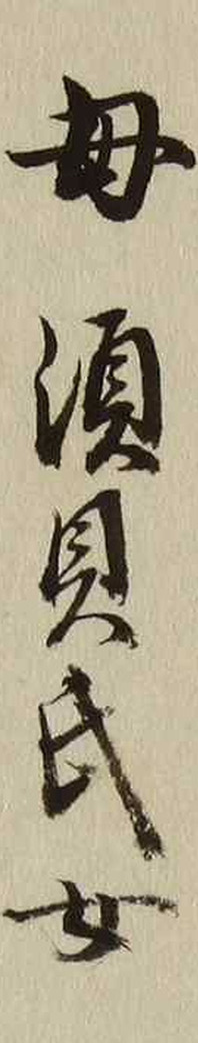母須貝氏女
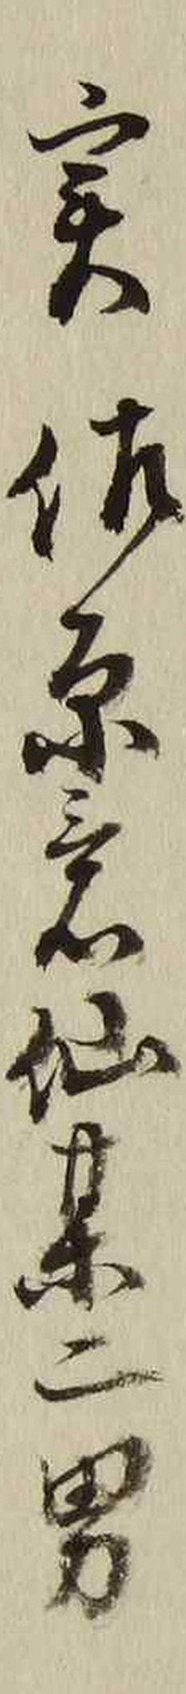実佐原意仙某二男
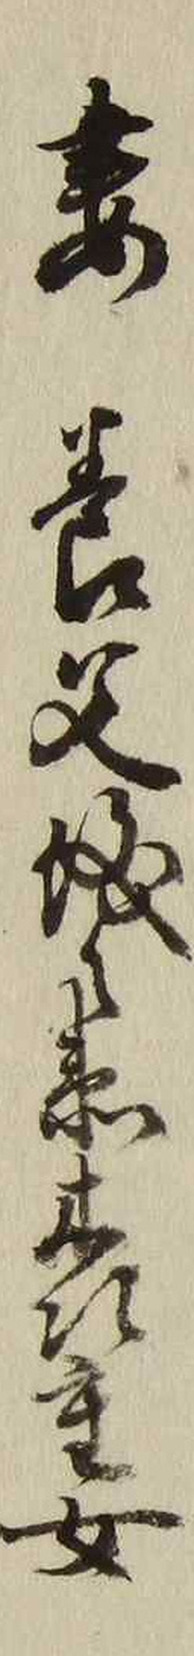妻養父儀兵衛森重女
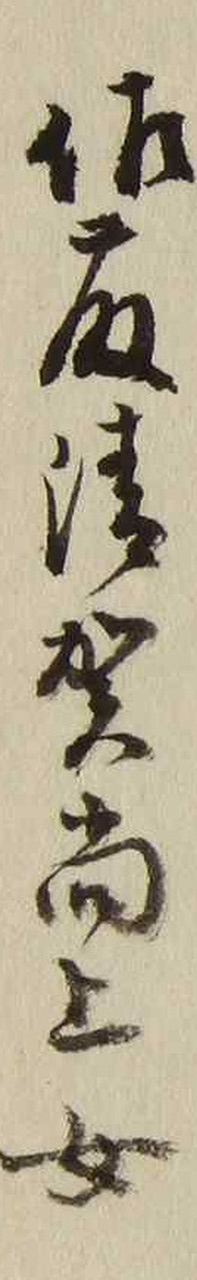佐藤清賀尚上女

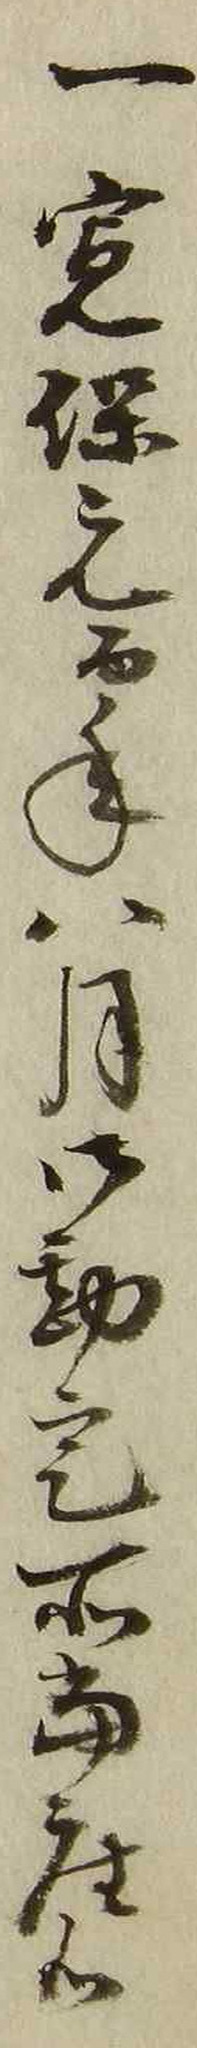一寛保元酉年八月御勘定所当座御
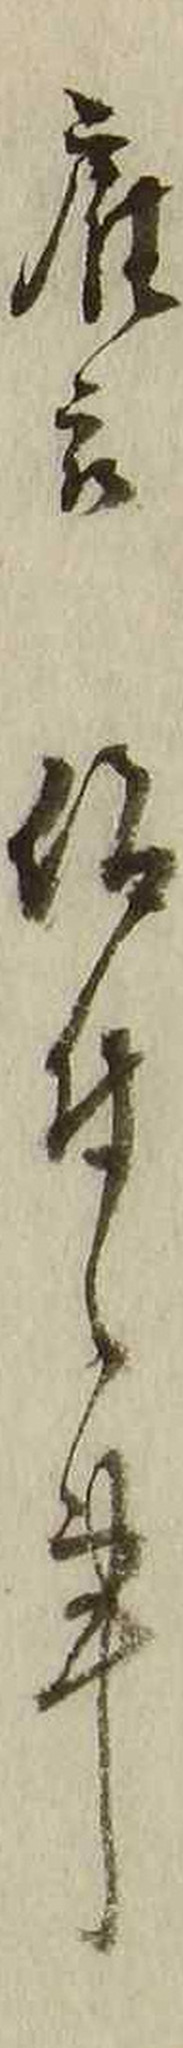雇被仰付候事
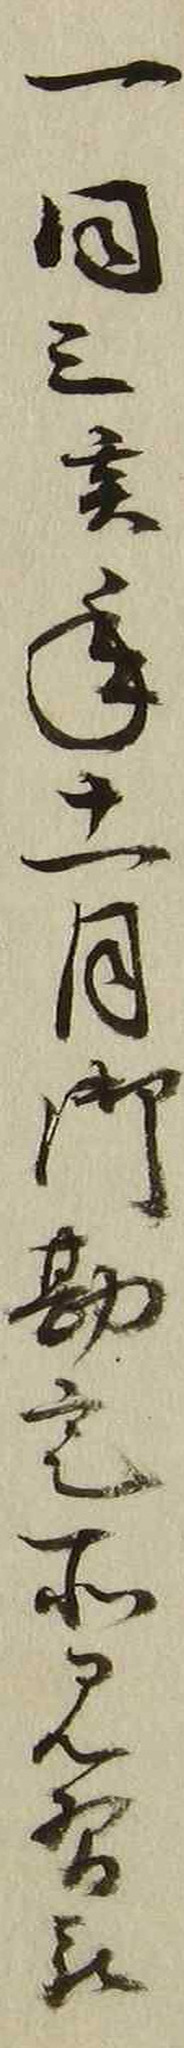一同三亥年十一月御勘定所見習被
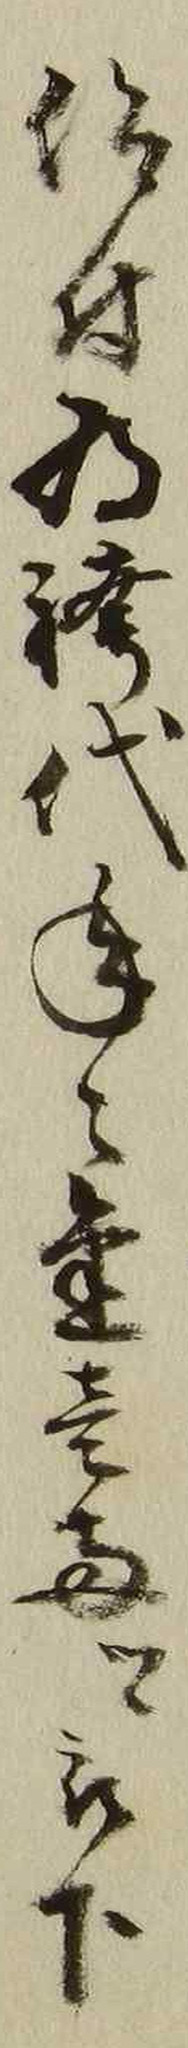仰付為袴代年に金壱両ツヽ被下
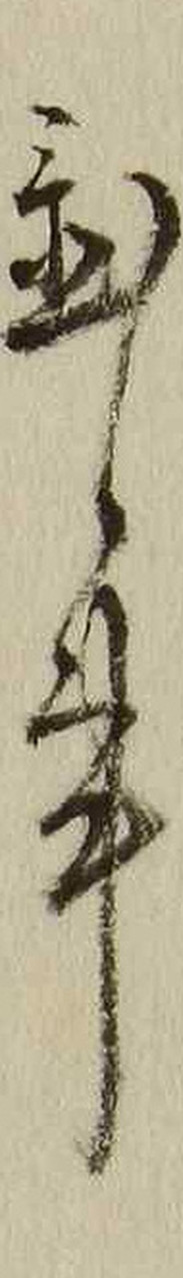置候事
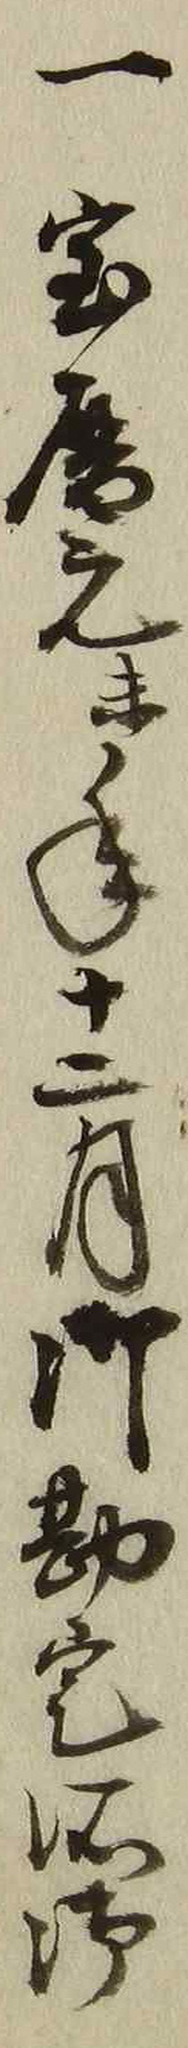一宝暦元未年十二月御勘定所御
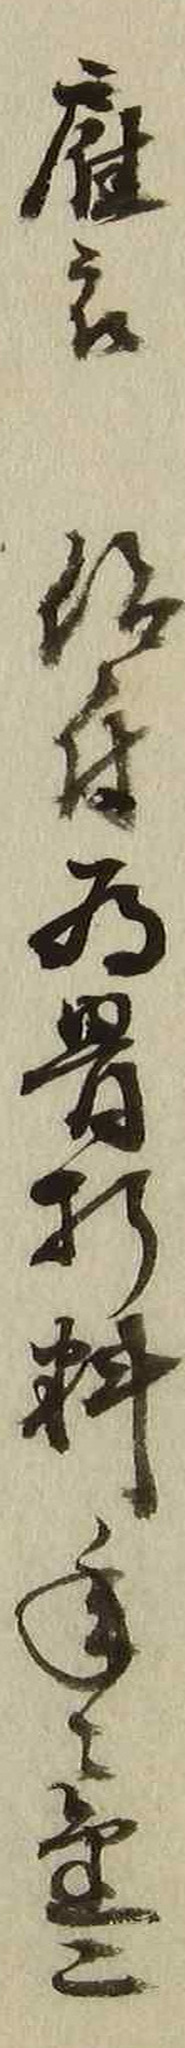雇被仰付為骨折料年に金二
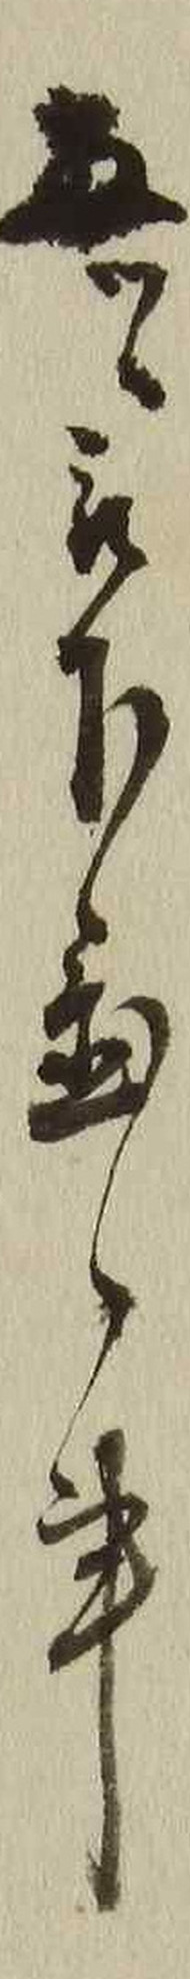両ツヽ被下置候事
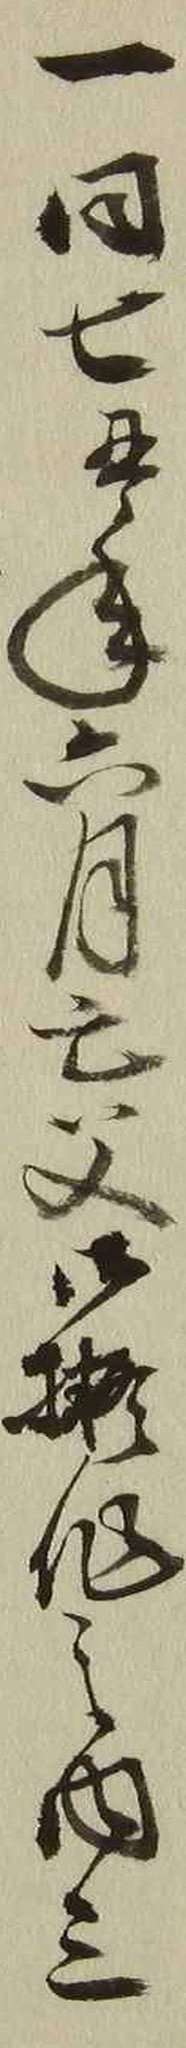一同七丑年六月亡父御擬作之内三
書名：諸士系譜　巻之38　は之部6
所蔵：会津若松市立会津図書館
